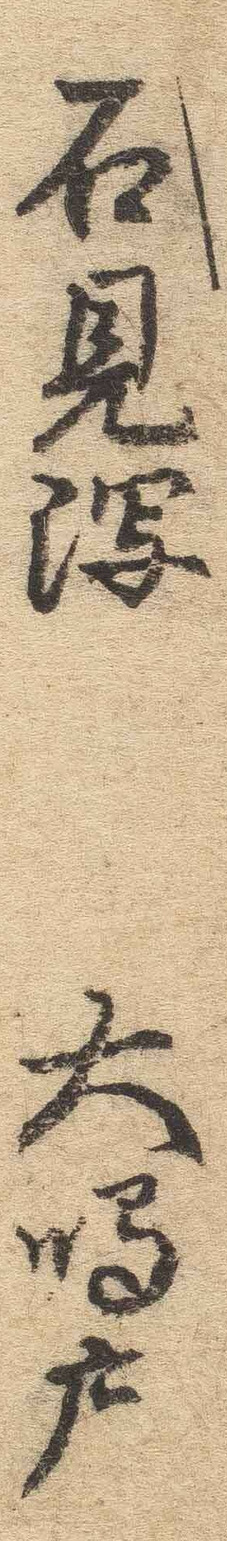石見潟大鳴戸
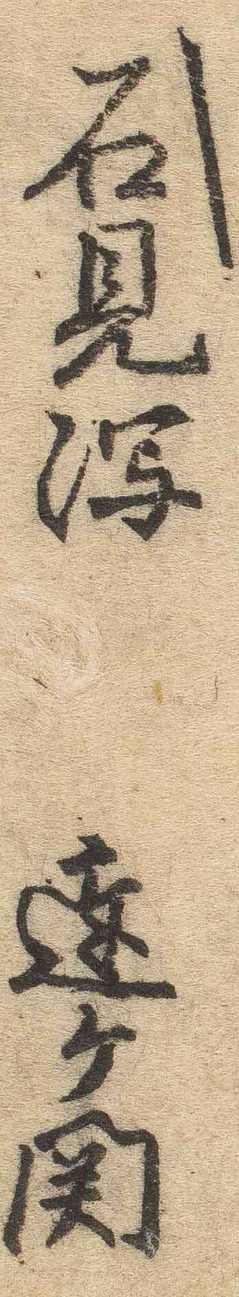石見潟達ケ関
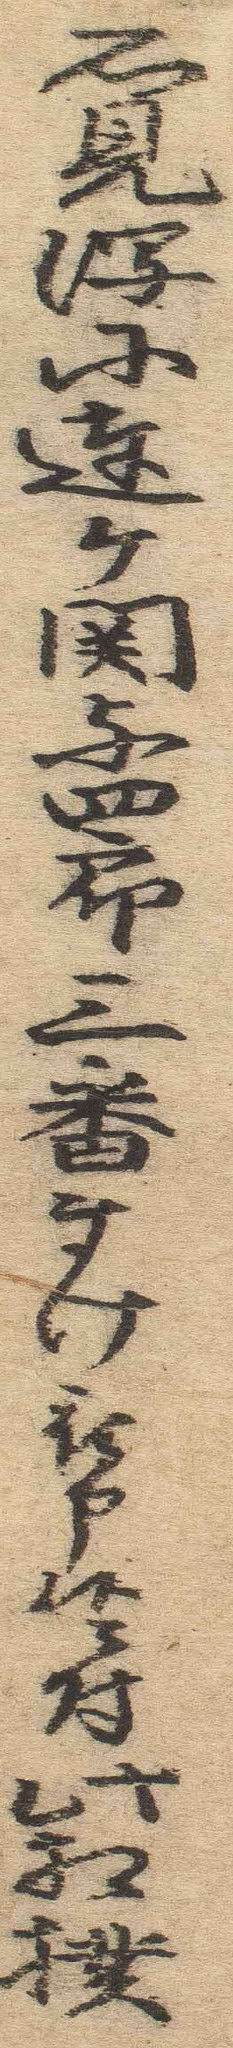石見潟に達ケ関与四郎三番まけ被申候ニ付此相撲
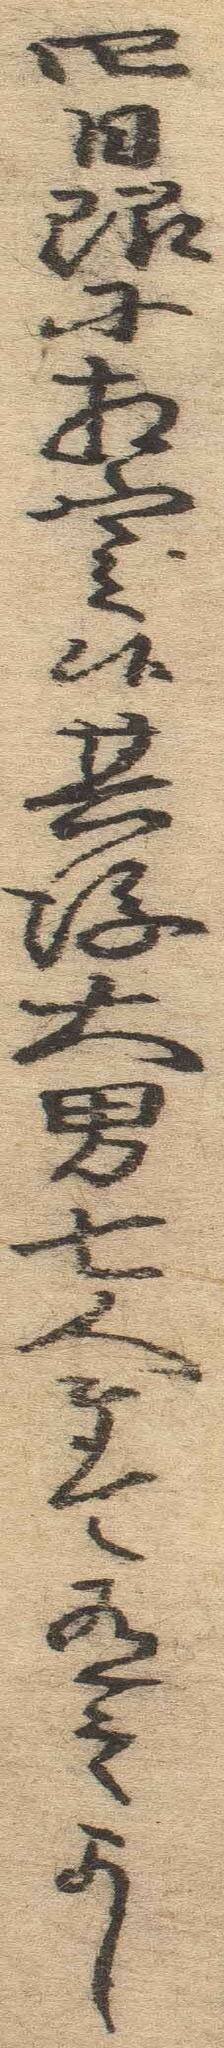四日限に相定候其後大男七人にて有之よし
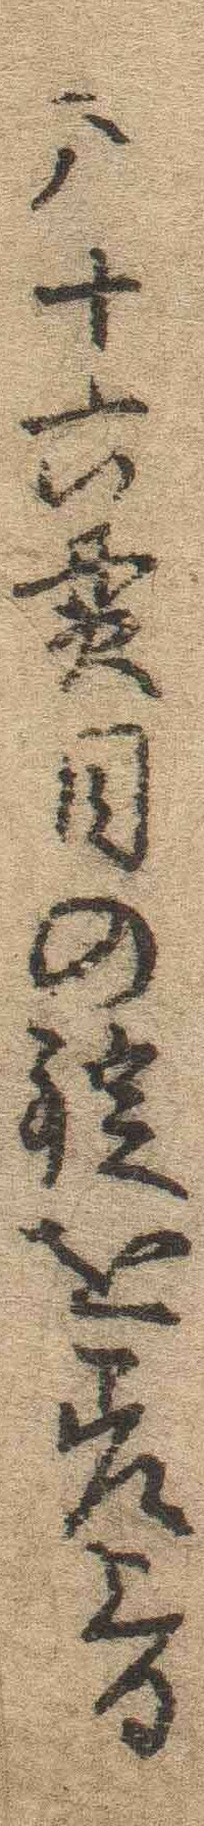六十六貫目の錠を差上る
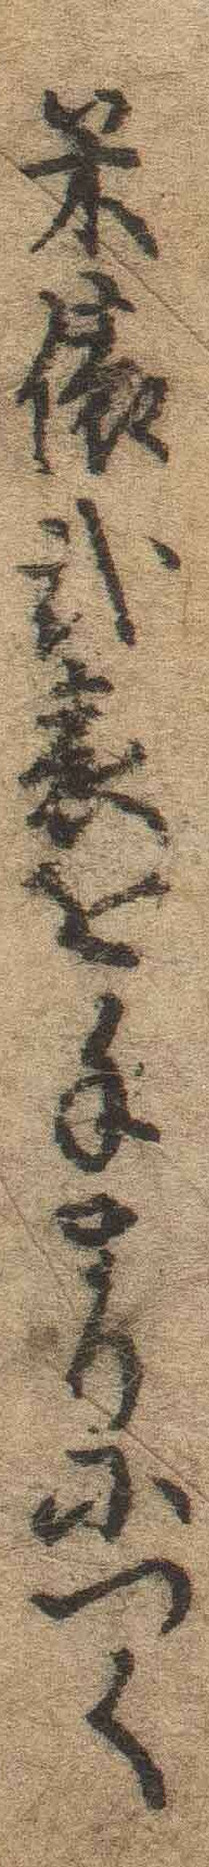米俵弐表を手まりにつく

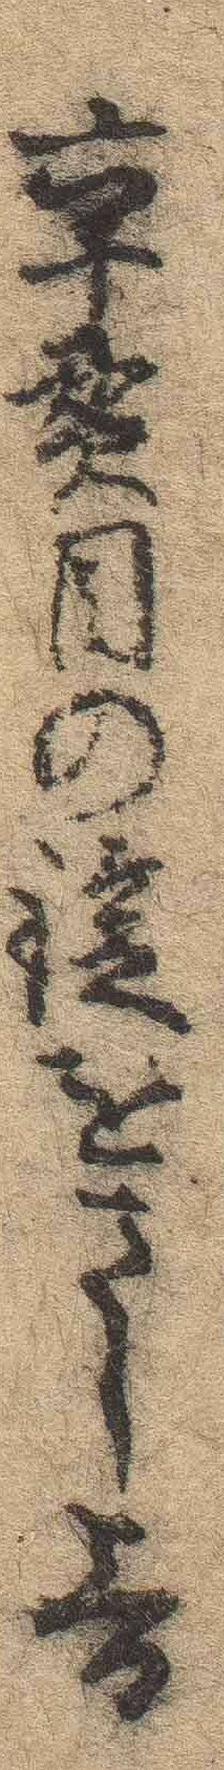六十貫目の錠をさし上る
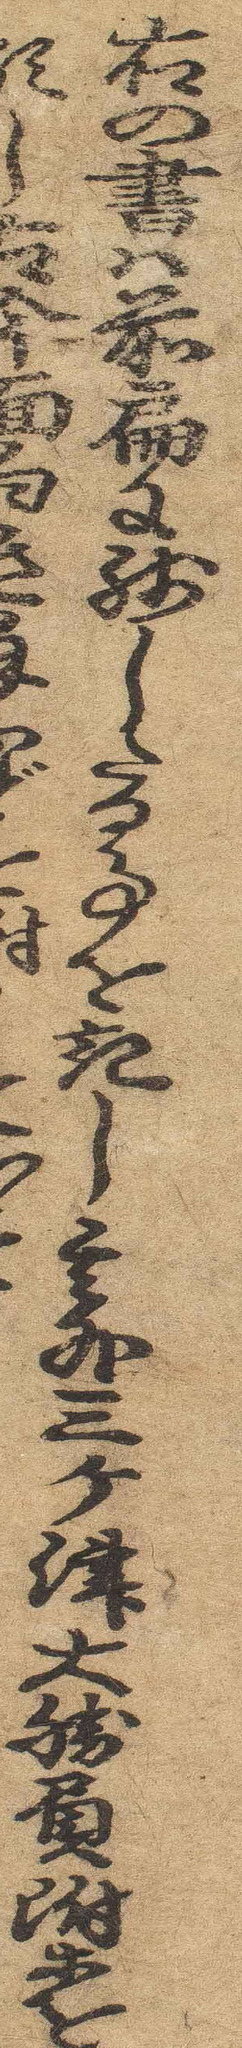右の書は前扁みに残したる事を記し其外三ケ津大勝負附等を
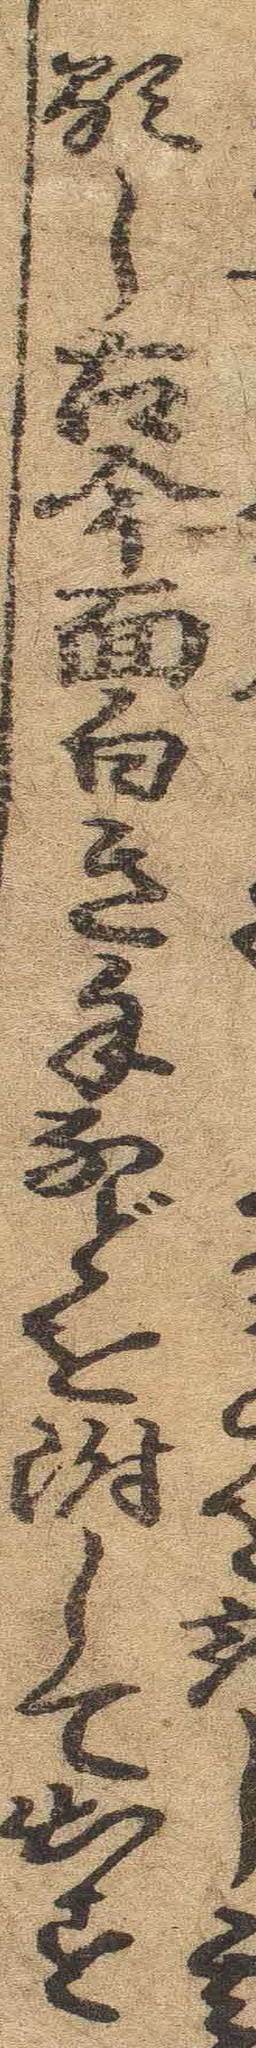顕し古今面白き手などを附して出す
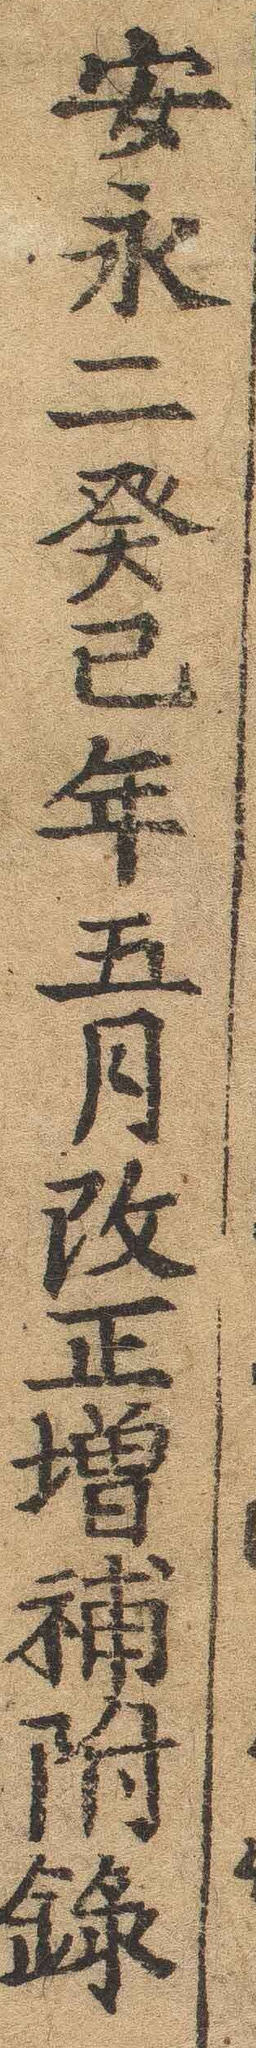安永二癸己年五月改正増補附録
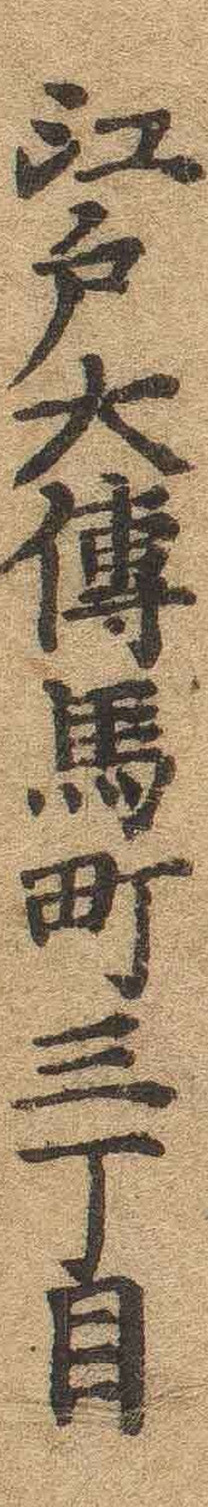江戸大伝馬町三丁目
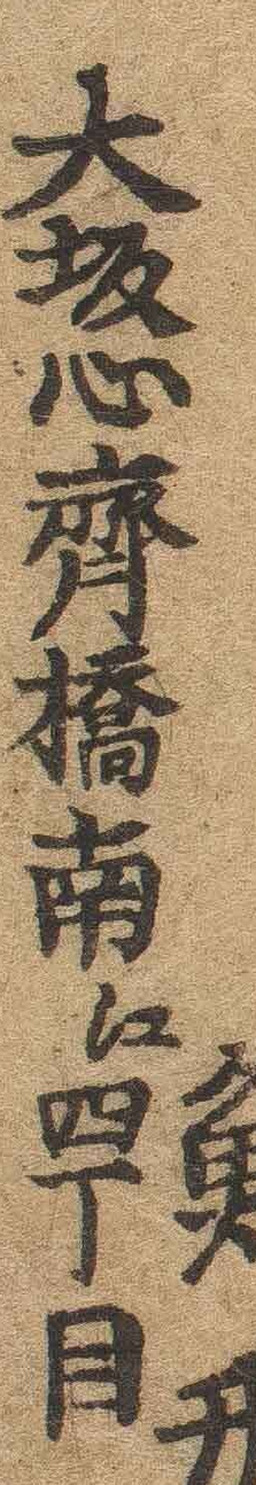大坂心斎橋南江四丁目
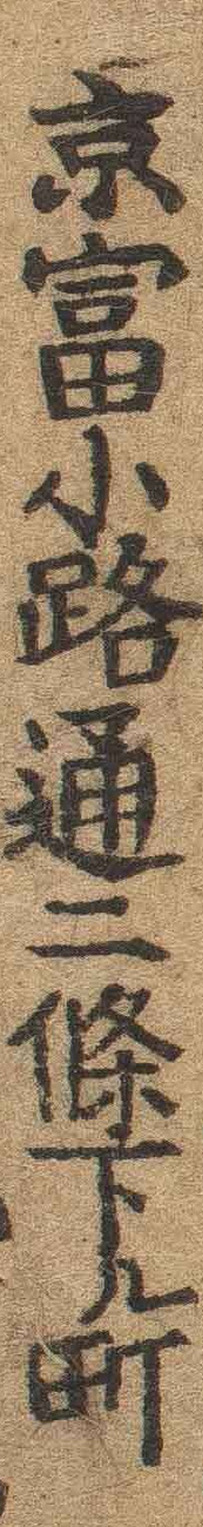京冨小路通二條下ル町
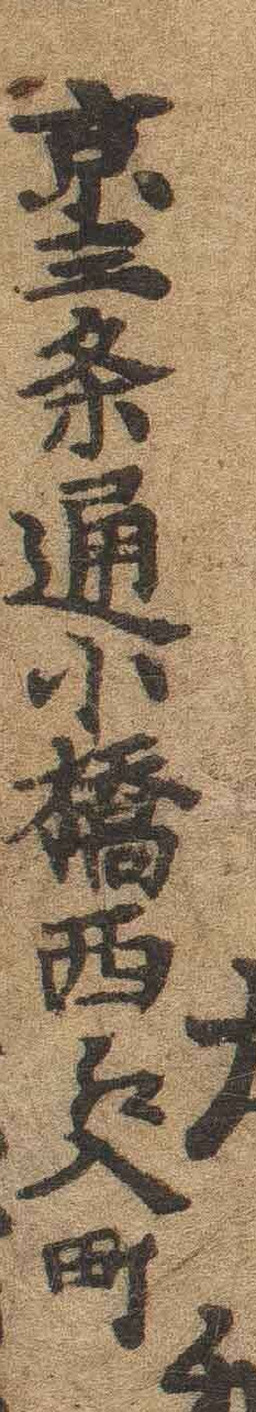京五状条通小橋西江入町
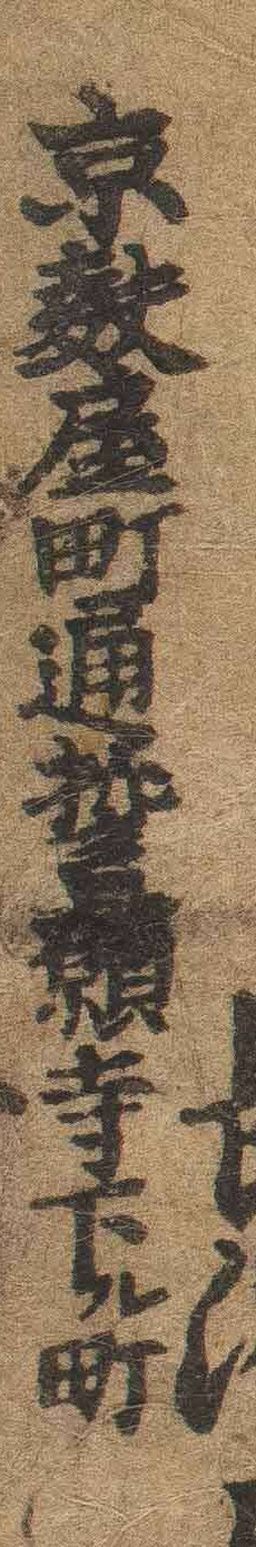京麩屋町通誓願時下ル町
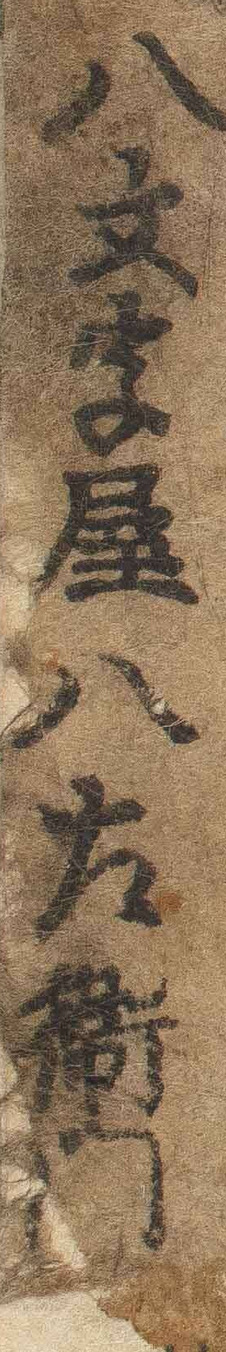八文字屋八左衛門
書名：古今相撲大全
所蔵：東京学芸大学附属図書館 国文学研究資料館
